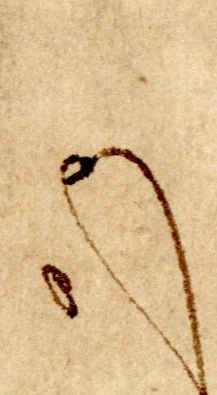To
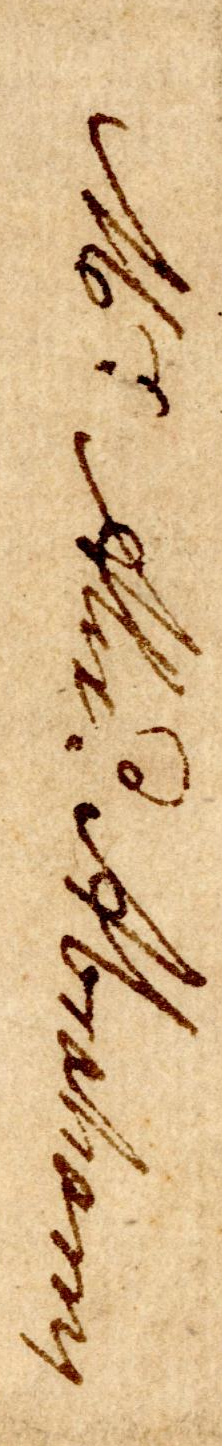M^r Alex^d. Abraham
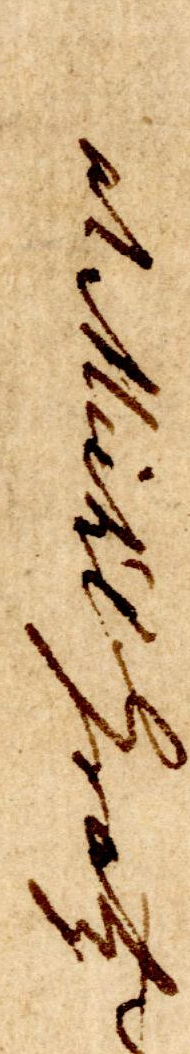at Mich^l Gratz
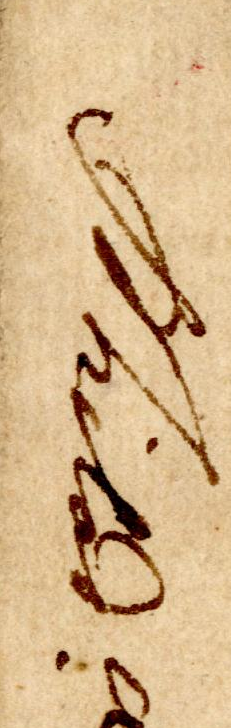Philad^a
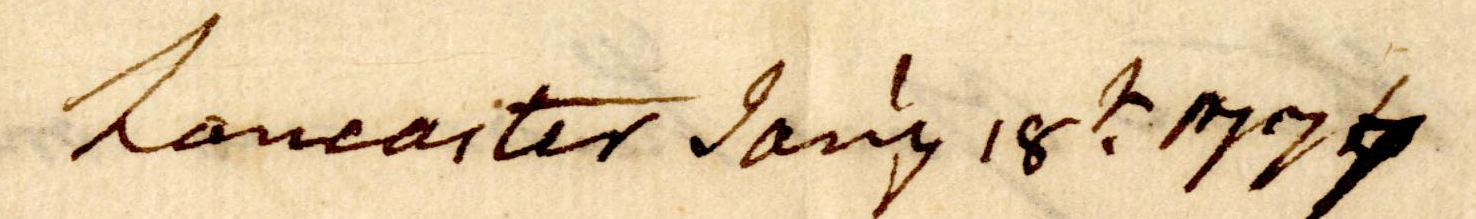Lancaster Jan'y 18^h. 1777
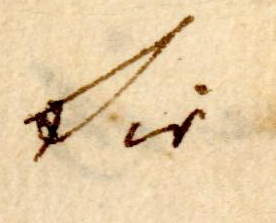Sir
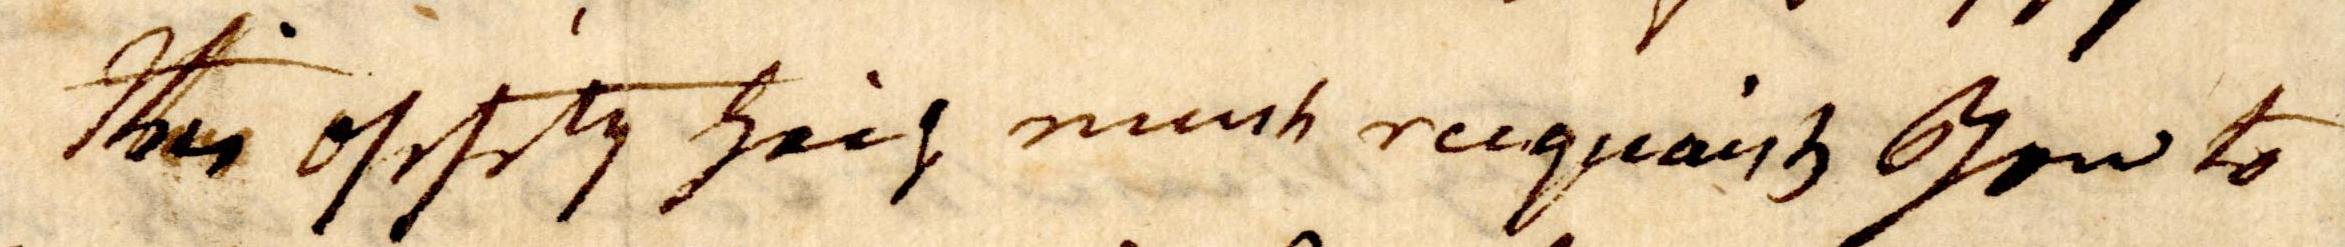This opp^ty Givg much requairs you to
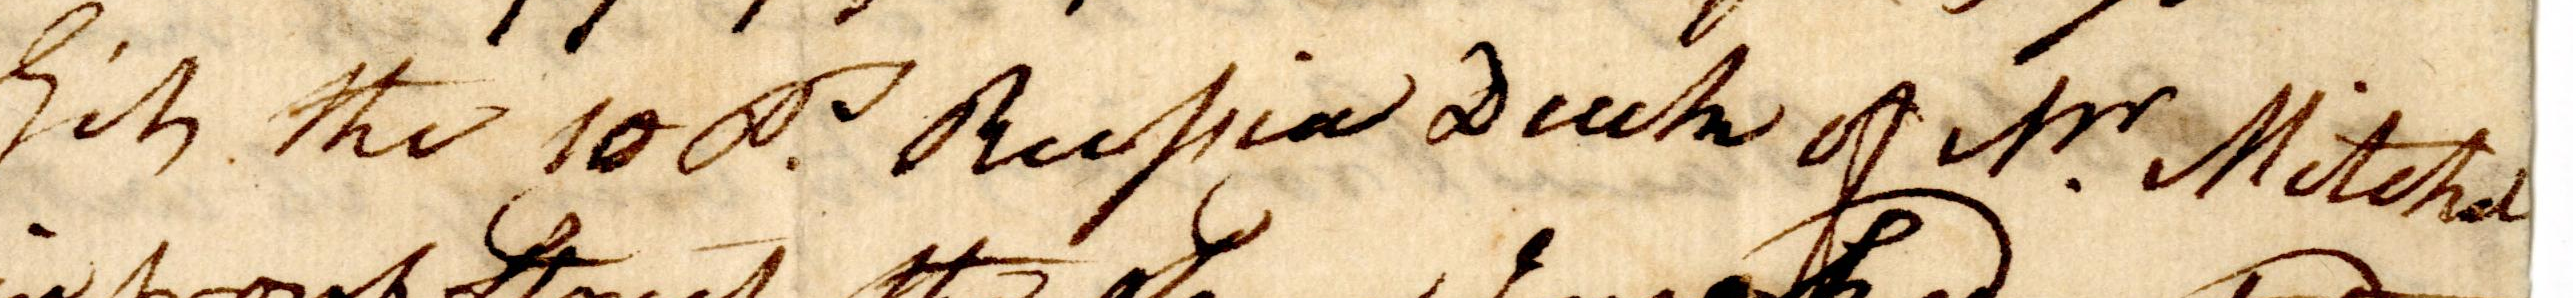git the 1000^s. Recpia Duck of M^r Mitchal
